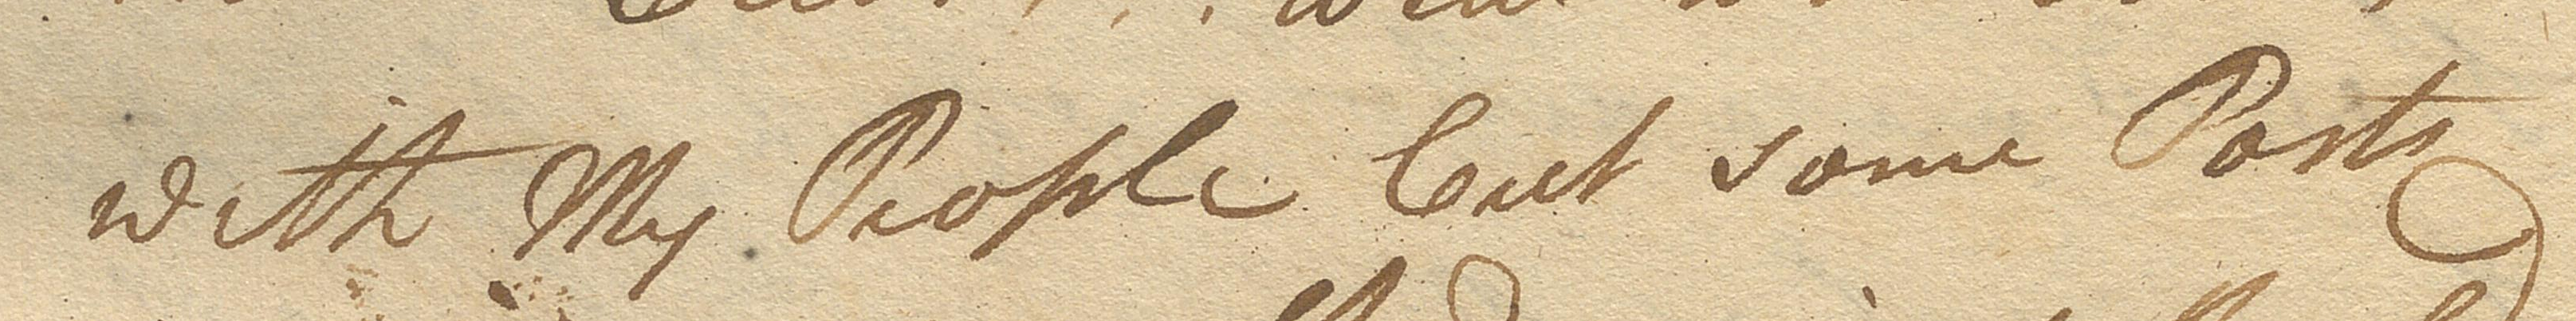with My People Cut some Posts
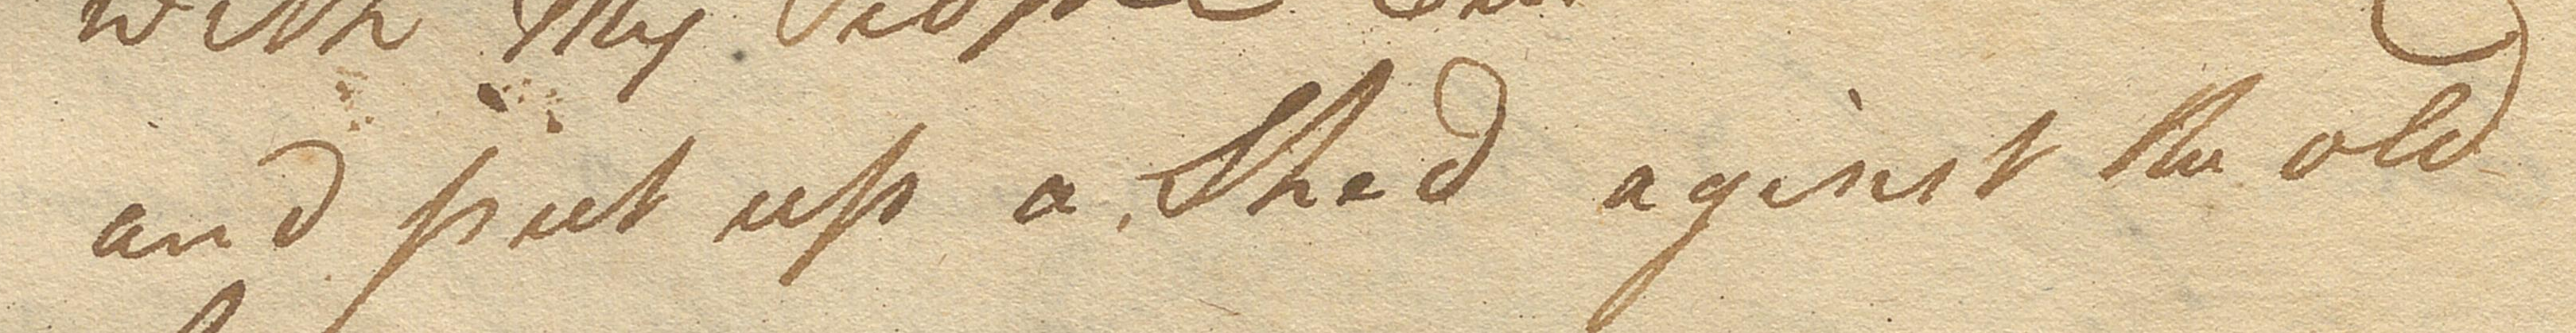and pet up a shed aginst the old
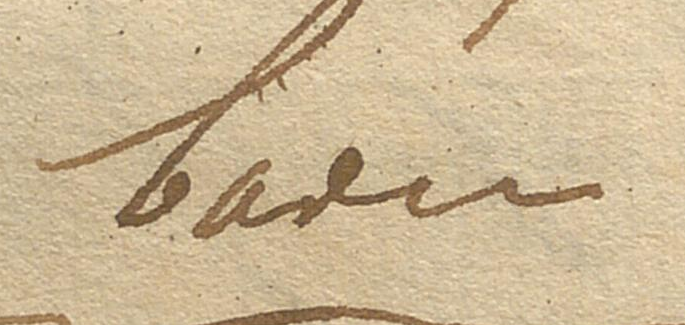barn
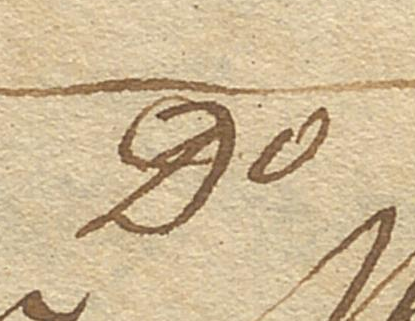D^o
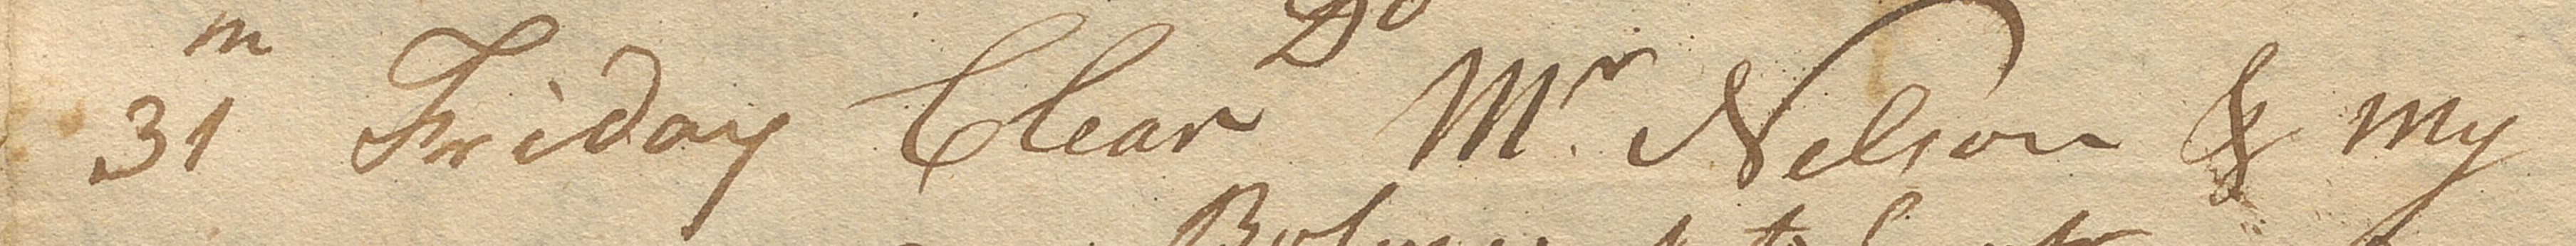31 Friday Clear M^r. Nelson & My
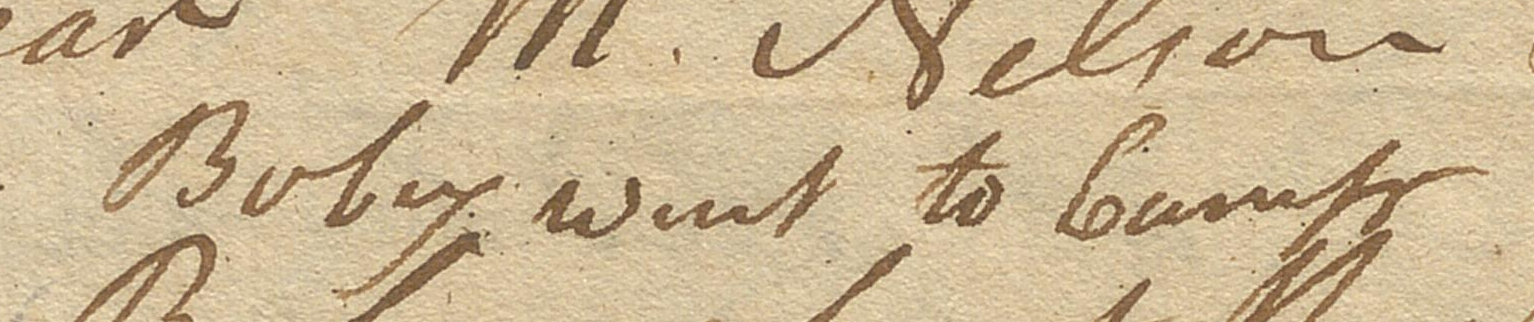Bobey went to Camp
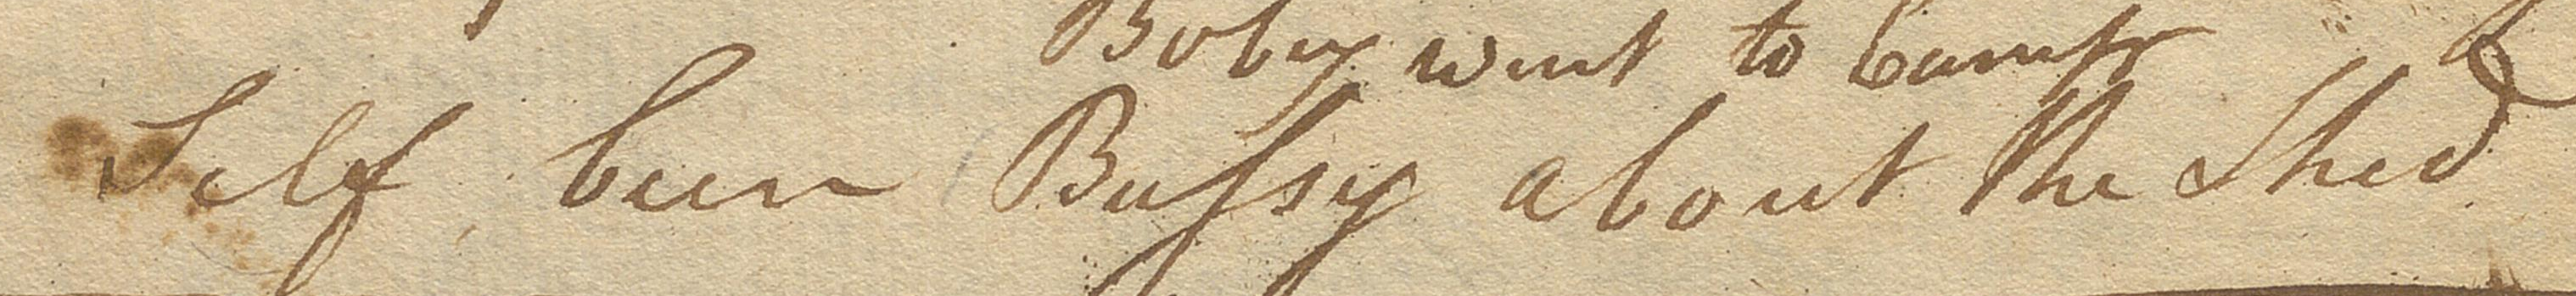self been Bussy about the Shed
